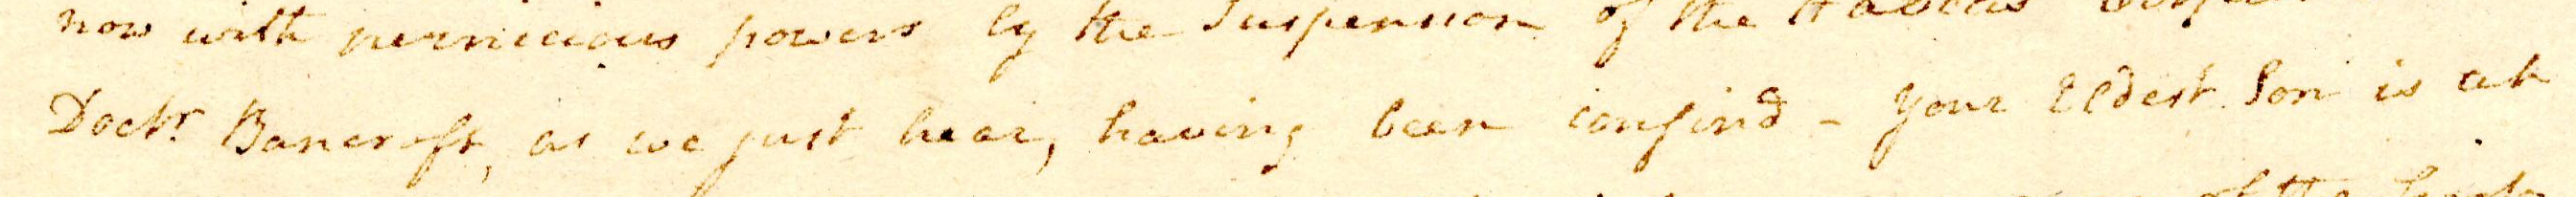Doct^r. Bancroft, as we just hear, having been confin'd Your Eldest Son is at
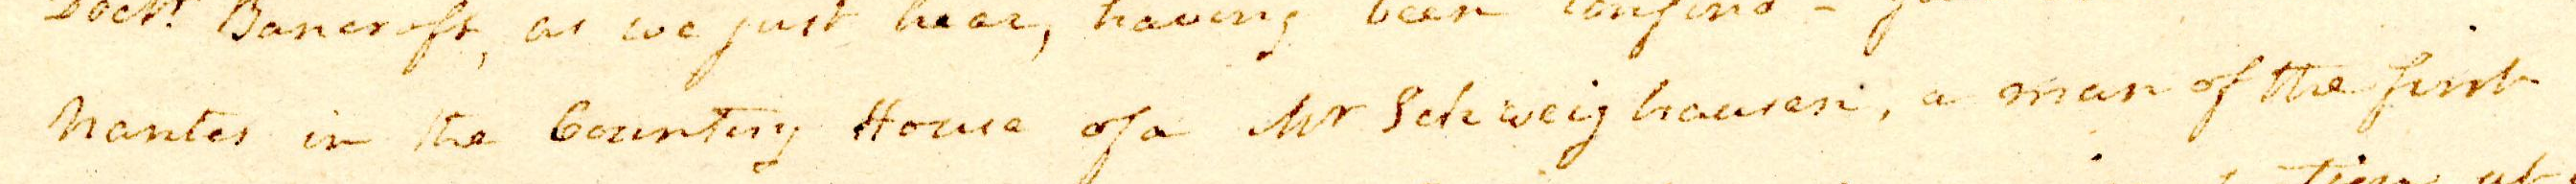nantes in the Country House of a M^r Schweighauser, a man of the first
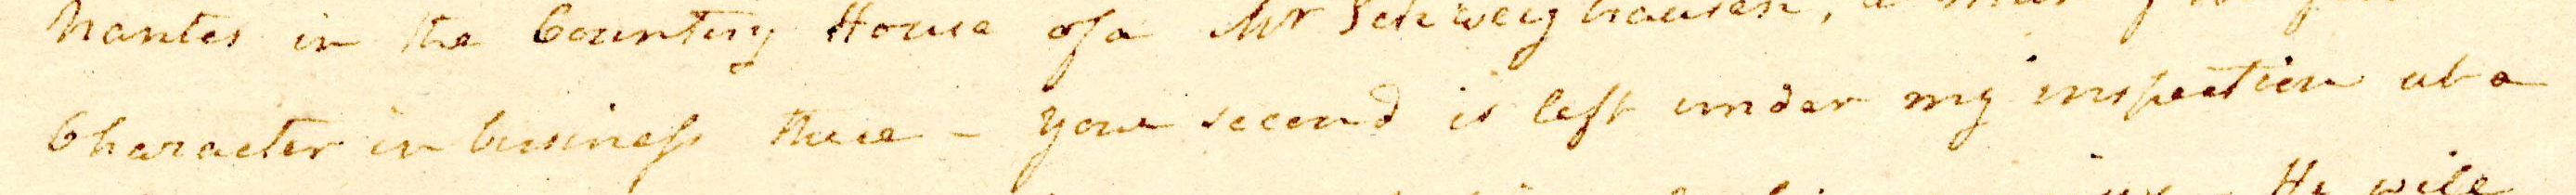Character in business there- your second is left under my inspection at a
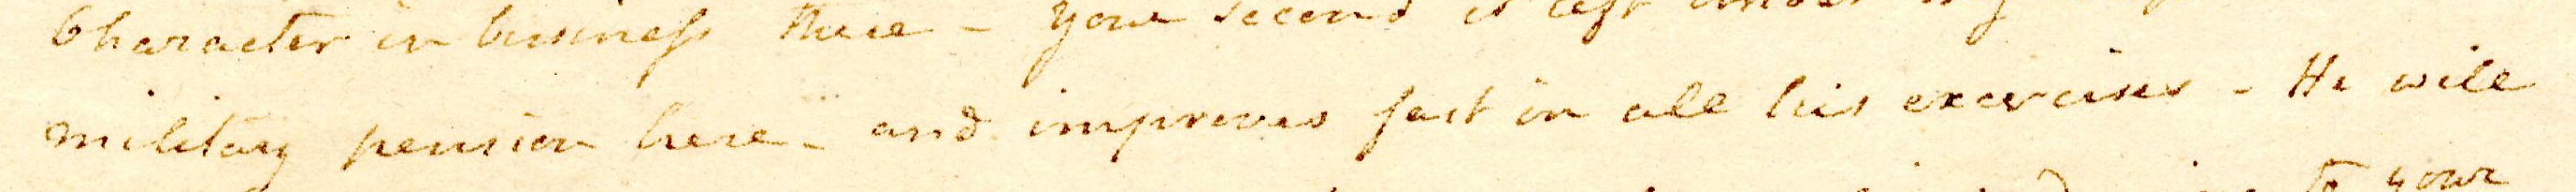military pension here- and improves fast in all his exercises. He will
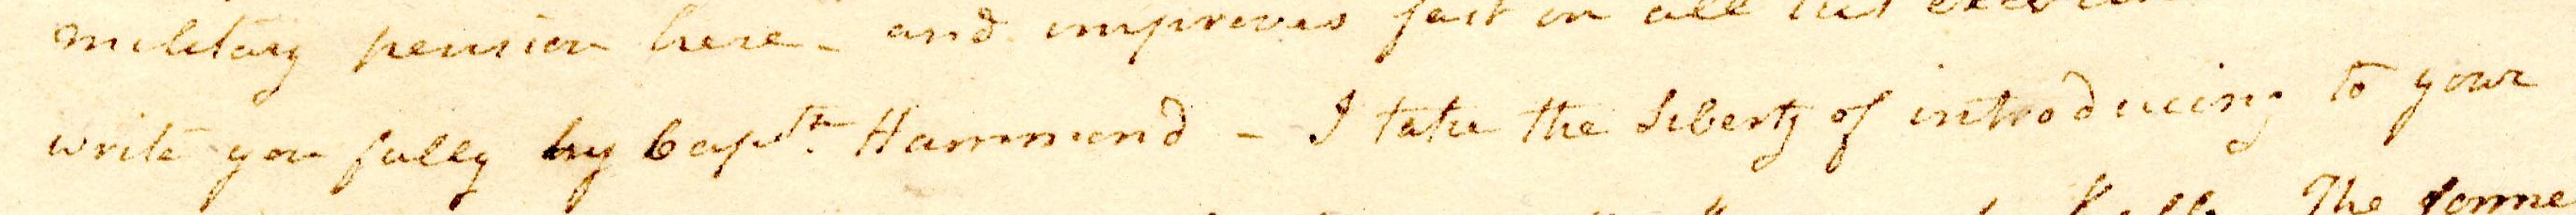write you fully by Cap^t. Hammon'd- I take the liberty of introducing to your
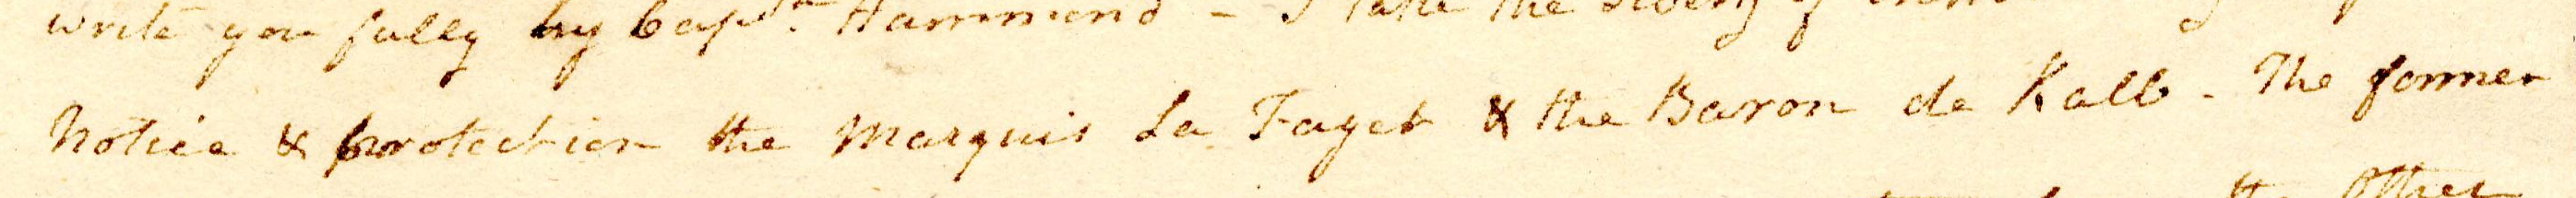Notice & protection the Marquis La Fayet & the Baron de Kalb. The former
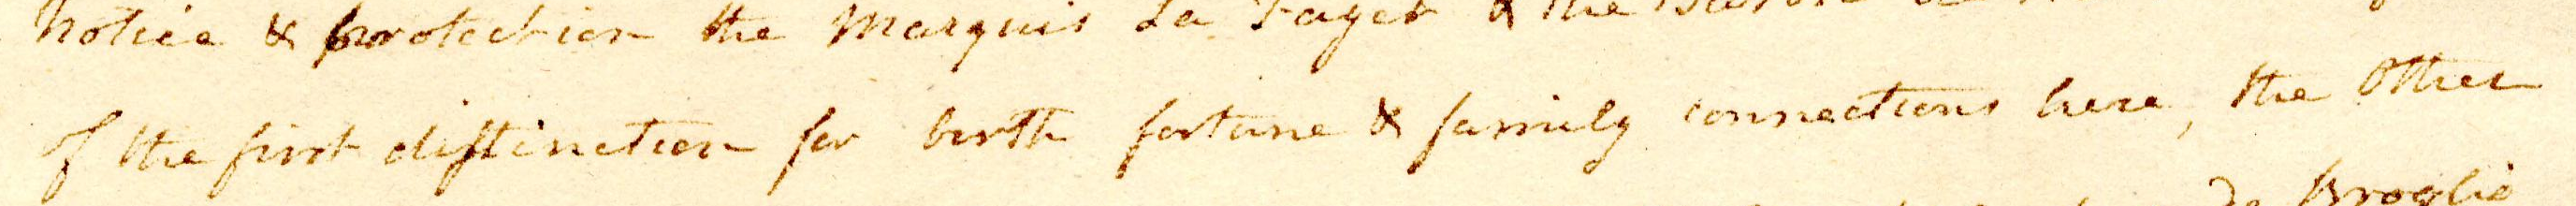of the first distinction for both fortune & family connections here the other
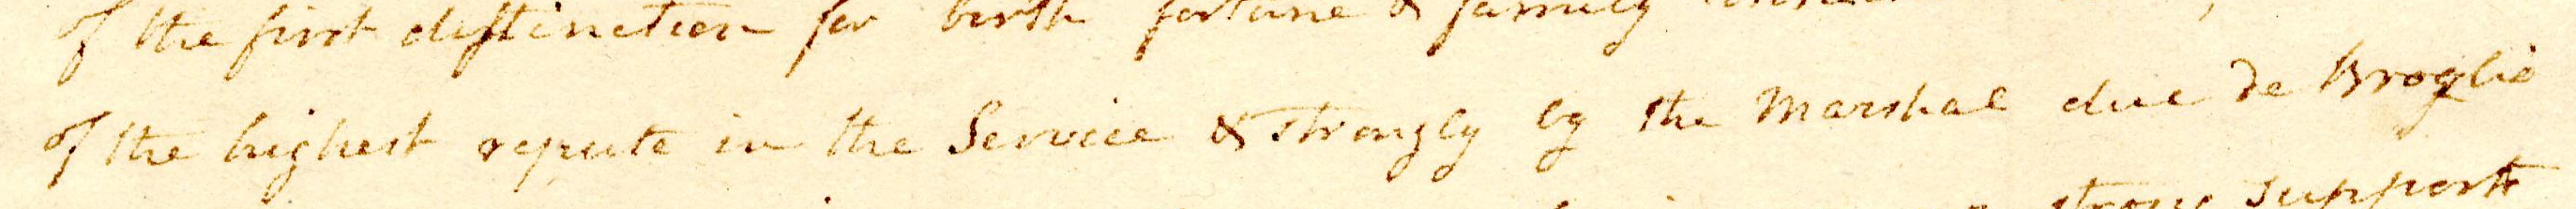of the highest repute in the service & strongly by the Marshal due de Broglis
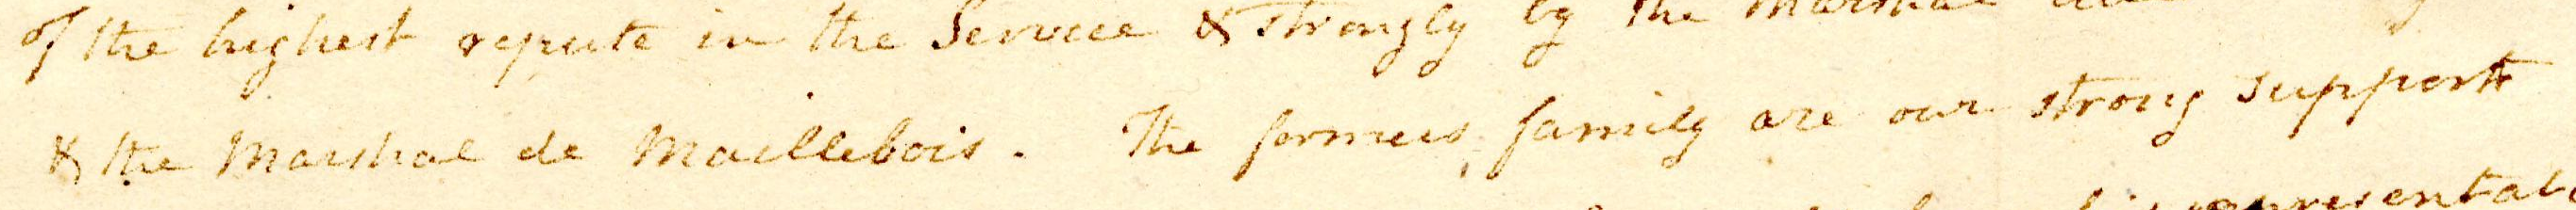& the marshal de maillebois. The former family are our strong supports
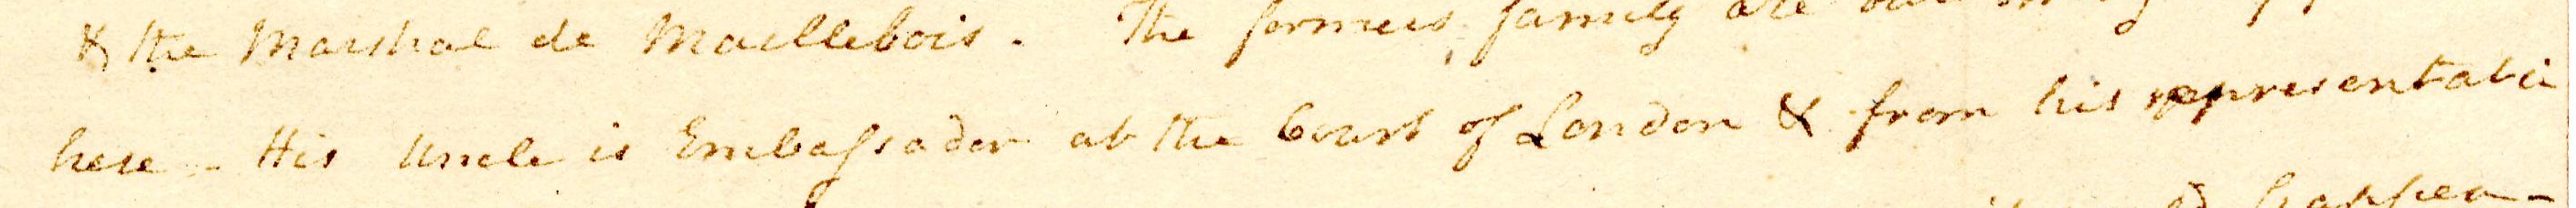here. His Uncle is Ambassador at the Court of London & from his representati-
